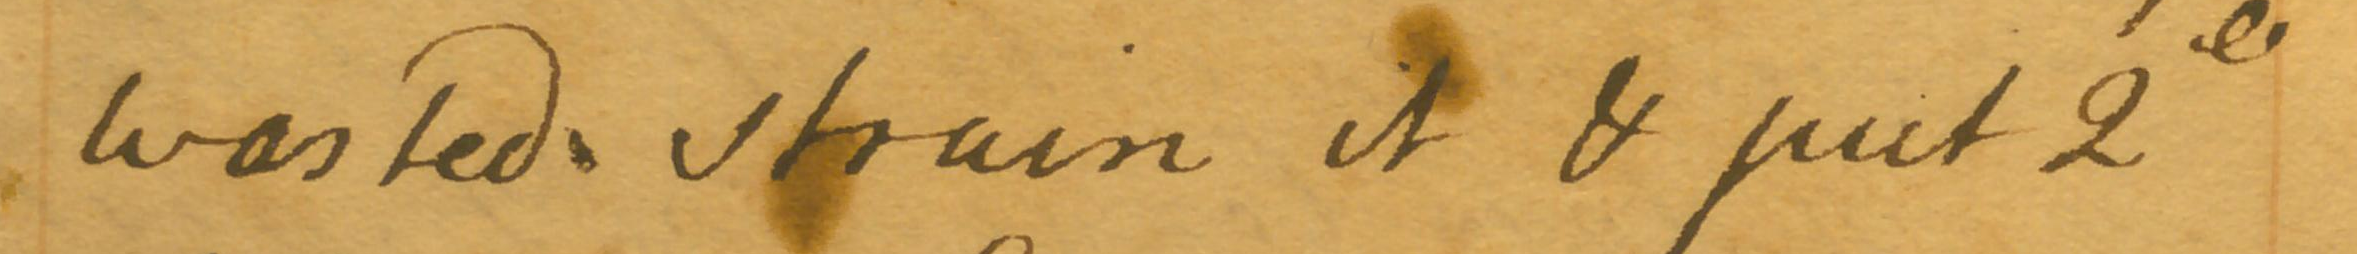wasted strain it & put 2 ^lb
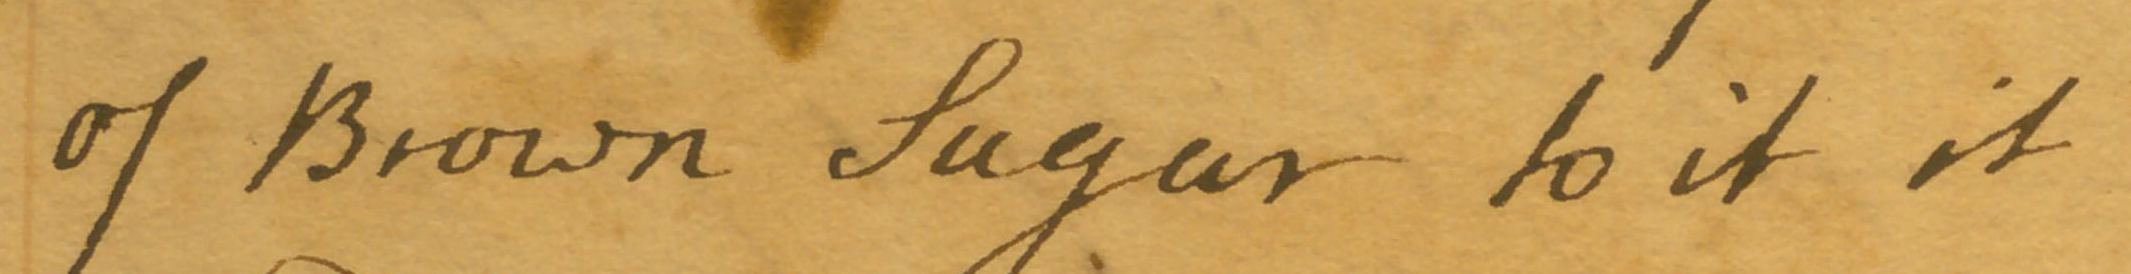of Brown sugar to it it
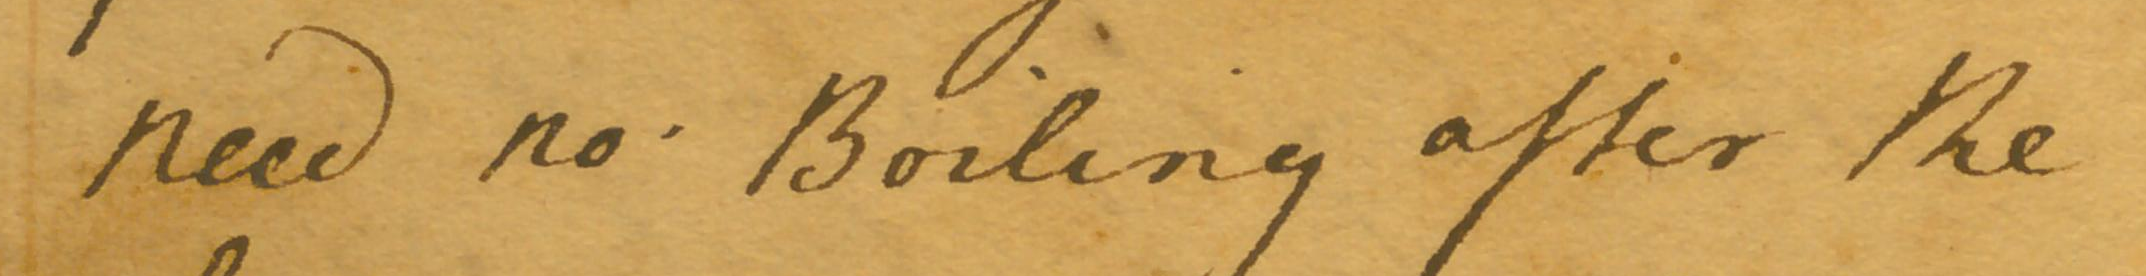need no Boiling after the
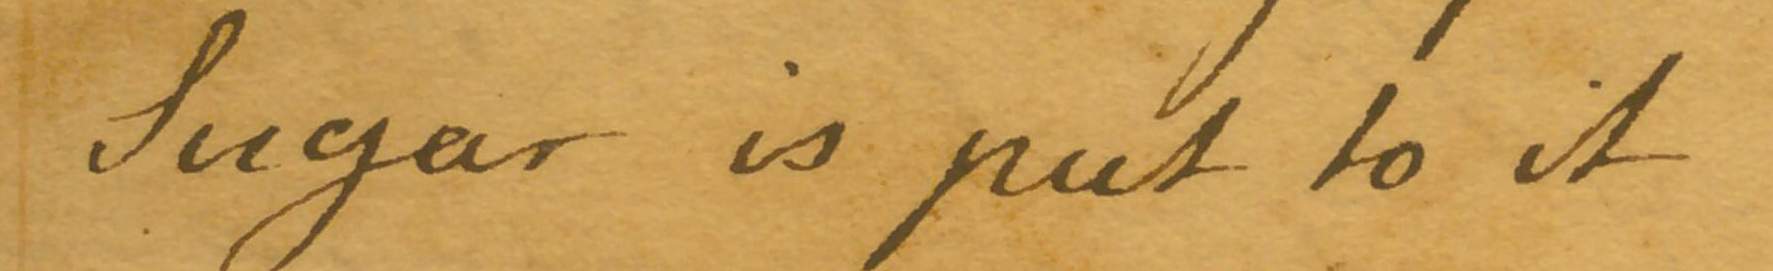Sugar is put to it
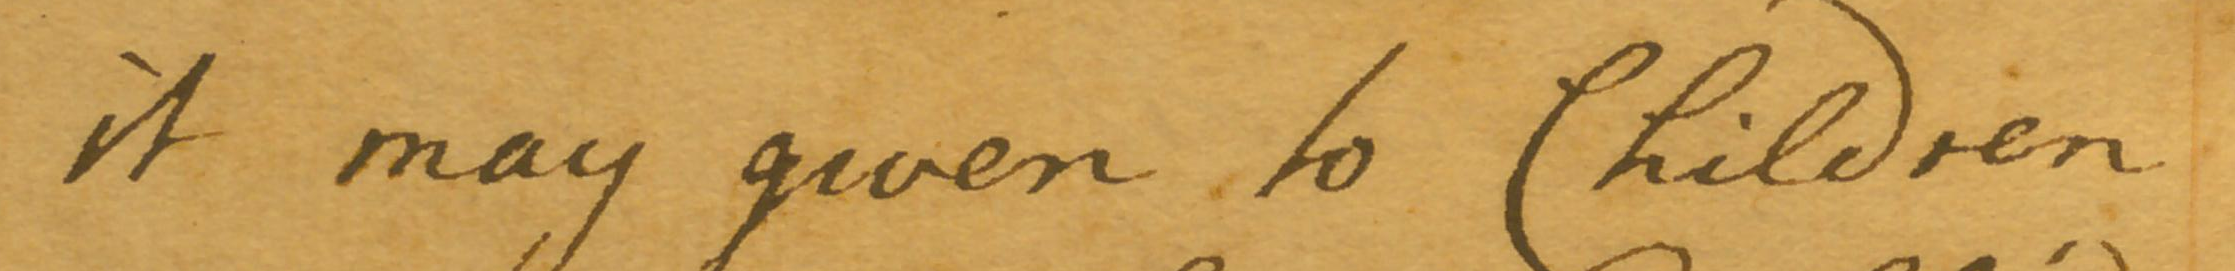it may given to Children
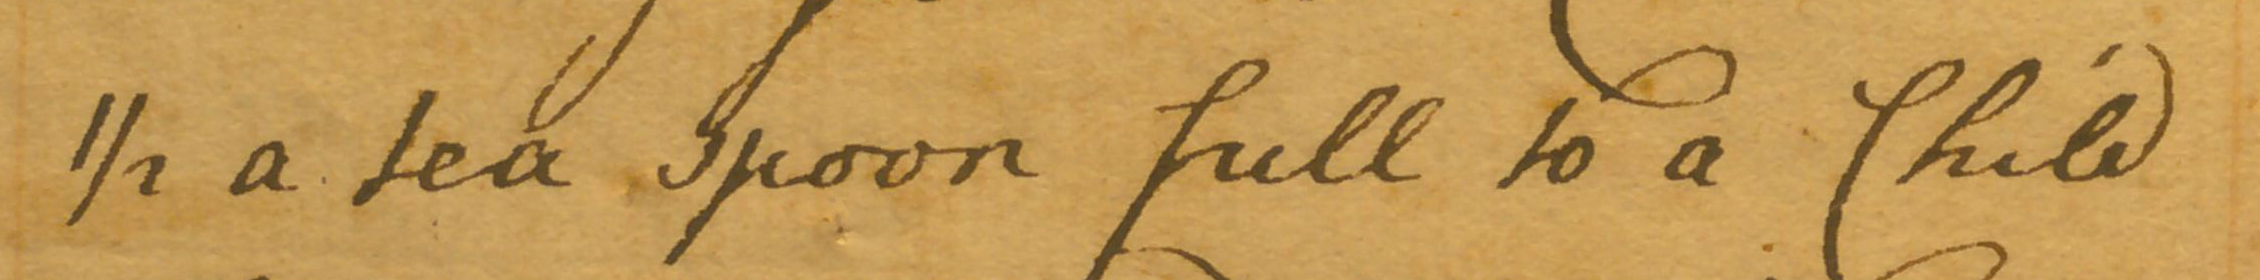1/2 a tea spoon full to a Child
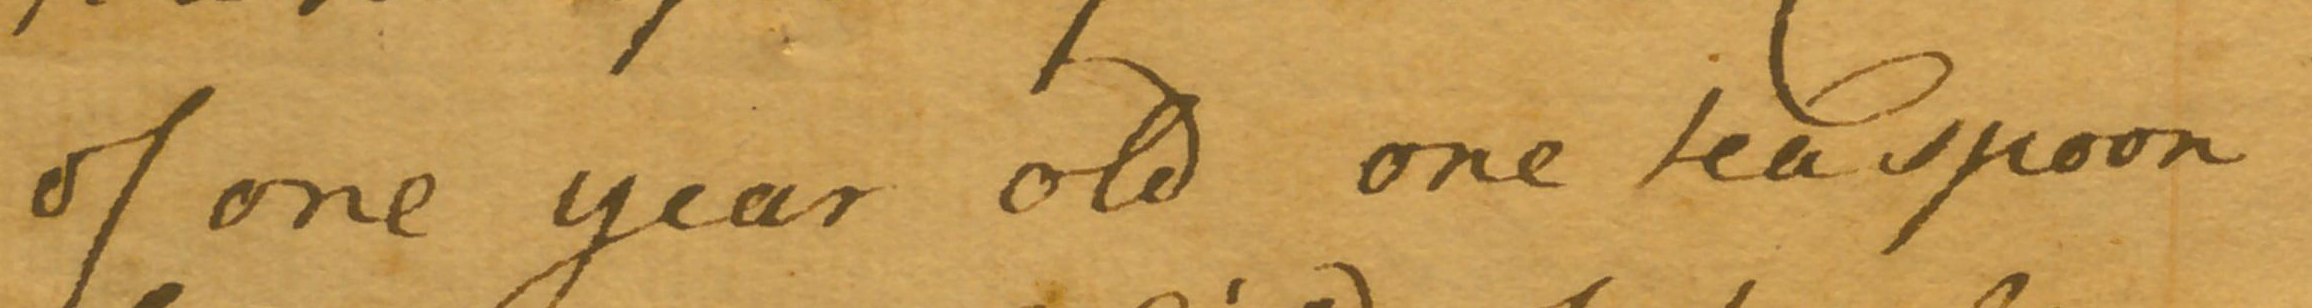of one year old one tea spoon
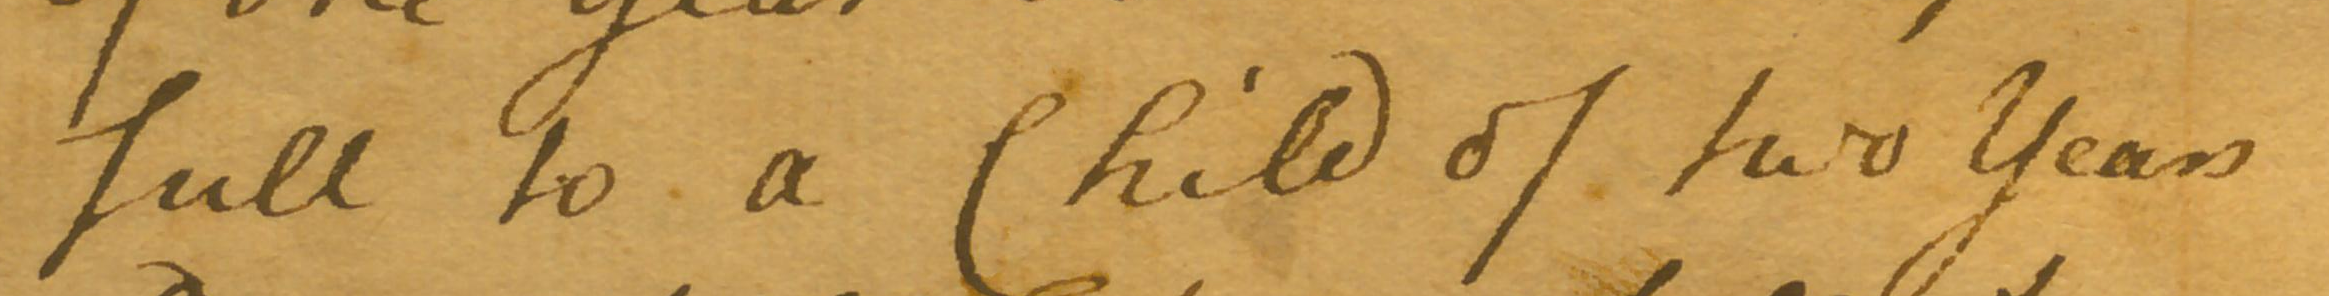full to a Child of two years
